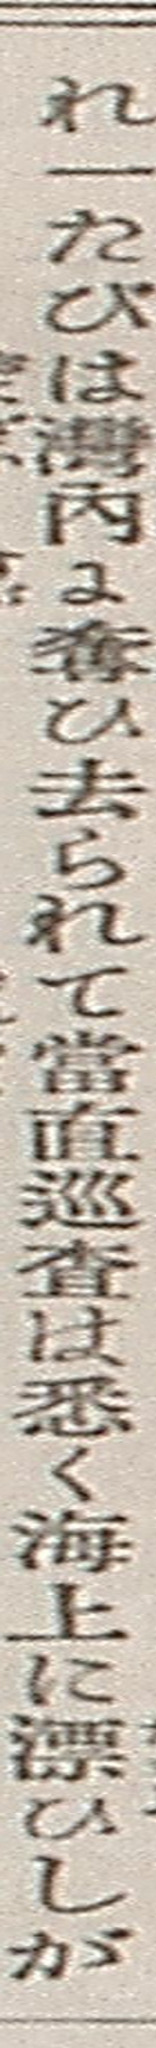れ一たびは湾内に奪ひ去られて当直巡査は悉く海上に漂ひしが
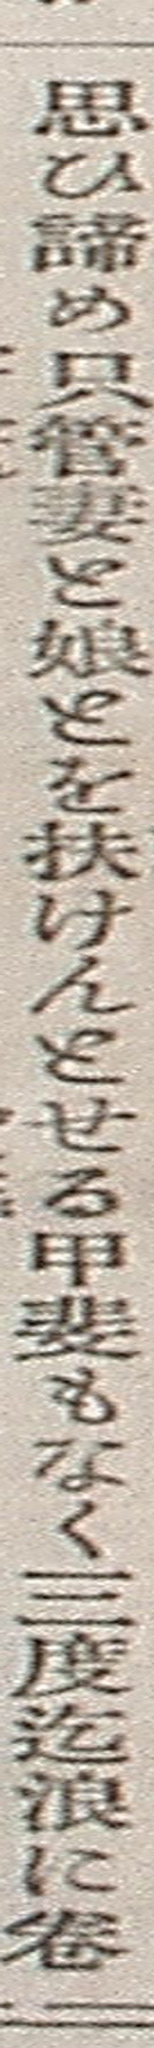思ひ諦め只管妻と娘とを扶けんとせる甲斐もなく三度迄浪に巻
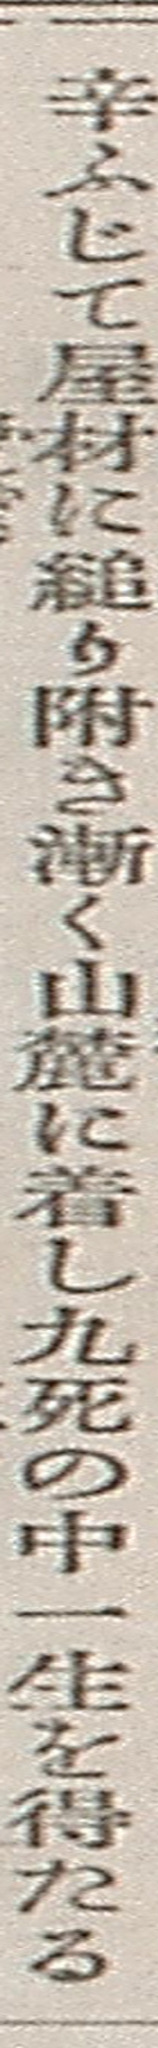辛ふじて屋材に縋り付き漸く山麓に着し九死の中一生を得たる
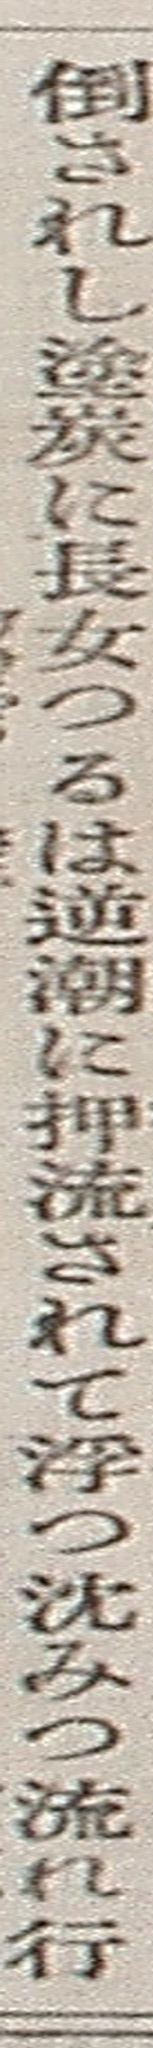倒されし塗炭に長女つるは逆潮に押流されて浮つ沈みつ流れ行
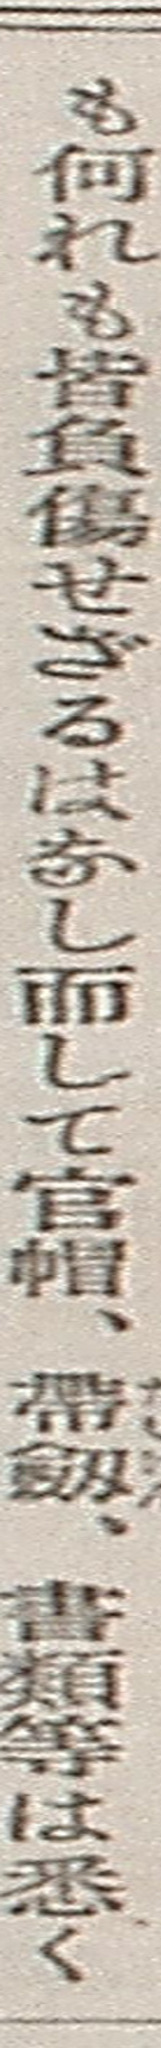も何れも皆負傷せざるはなし而して官帽、帯剣、書類等は悉く
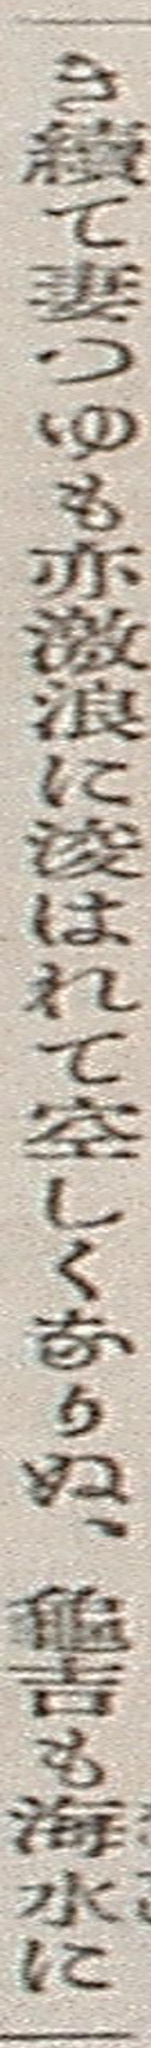き続て妻つゆも亦激浪に浚はれて空しくなりぬ、亀吉も海水に

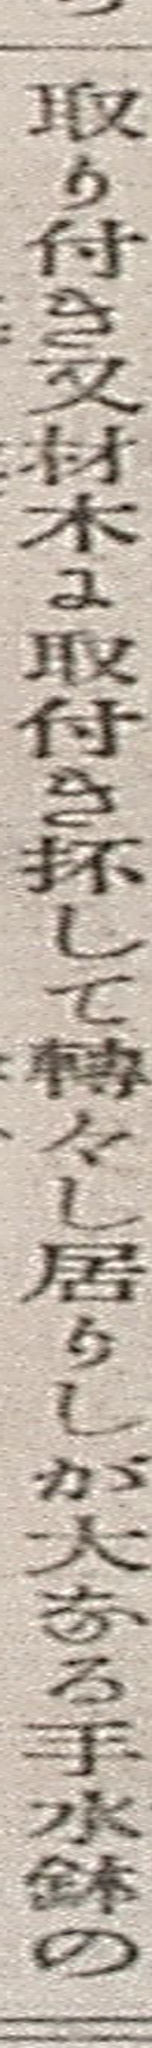取り付き又材木に取付き抔して転々し居りしが大なる手水鉢の
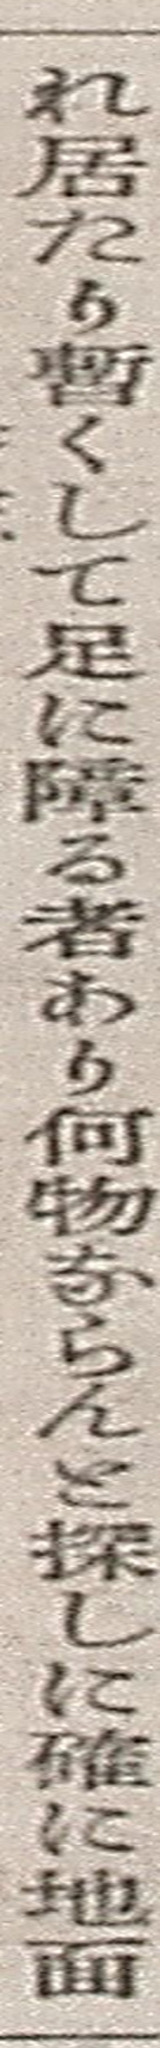れ居たり暫くして足に障る者あり何者ならんと探しに確に地面
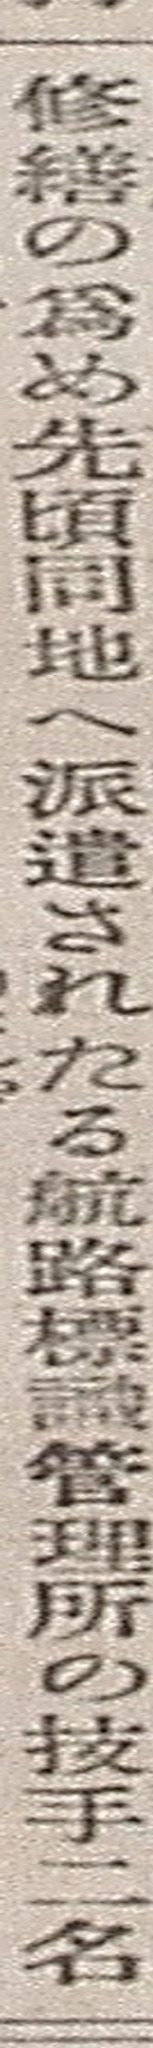修繕の為先頃同地へ派遣されたる航路標識管理所の技手二名
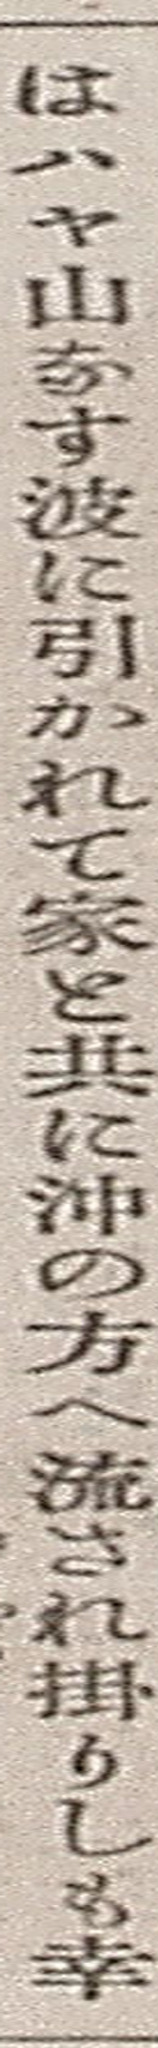はハヤ山なす波に引かれて家と共に沖の方へ流され掛りしも幸
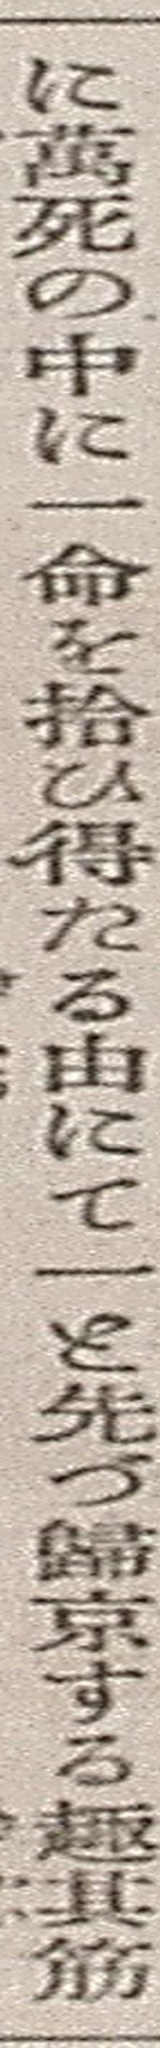に萬死の中に一命を拾ひ得たる由にて一と先づ帰京する趣其筋

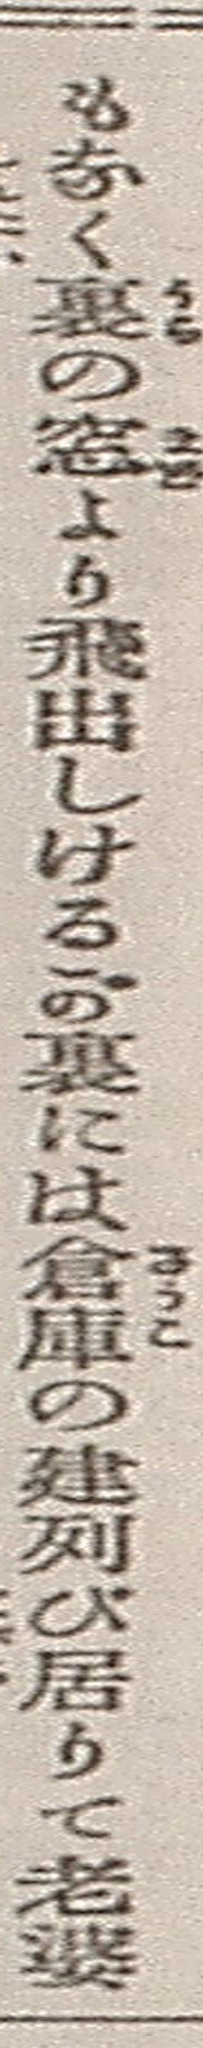もなく裏の窓より飛出しけるが裏には倉庫の建列び居りて老婆
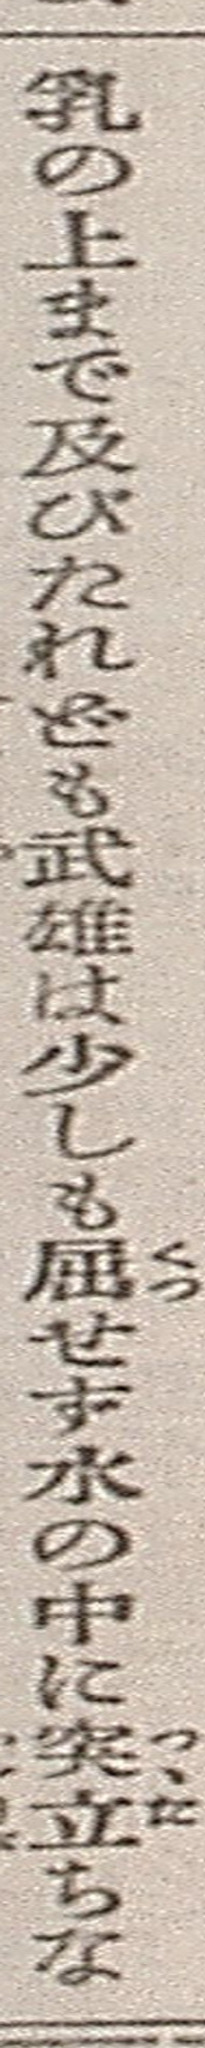乳の上まで及びたれども武雄は少しも屈せず水の中に突立ちな
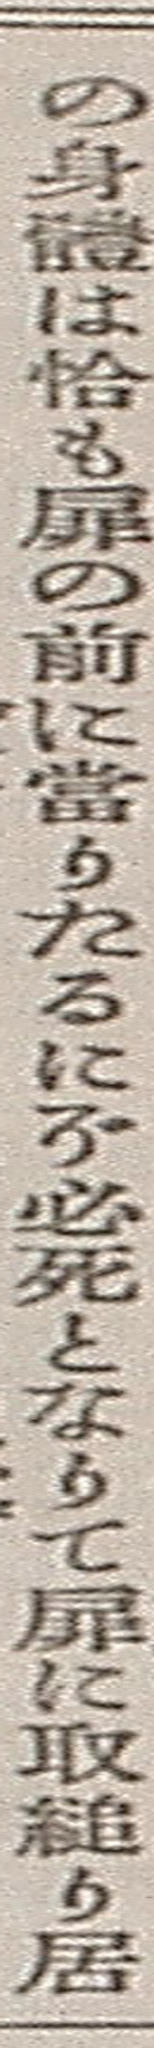の身体は恰も扉の前に当りたるにぞ必死となりて扉に取縋り居
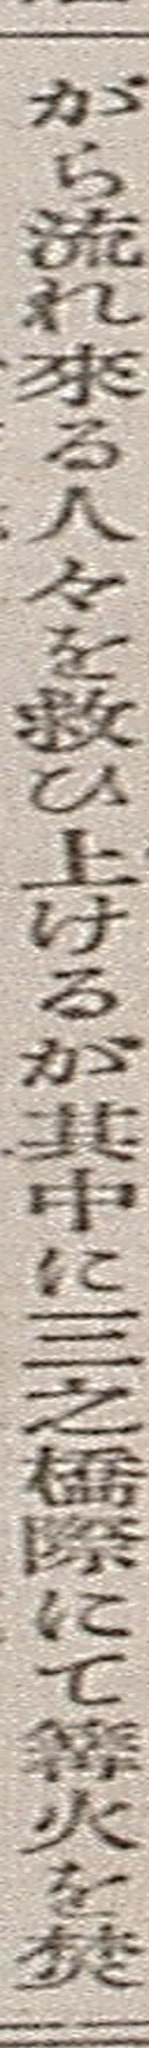がら流れ来る人々を救ひ上けるが其中に三之橋際にて篝火を焚
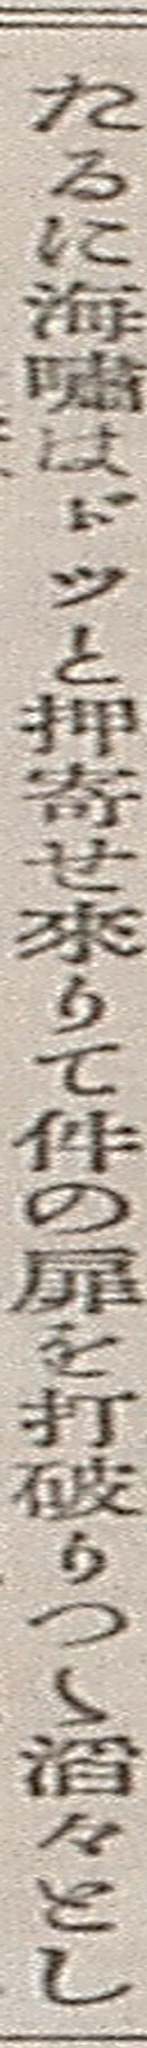たるに海嘯はドツと押寄せ来りて件の扉を打破りつゝ滔々とし
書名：風俗畫報臨時増刊第百十九號　大海嘯被害録（中）
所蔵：東京大学地震研究所図書室 Earthquake Research Institute Library, The University of Tokyo, JAPAN
